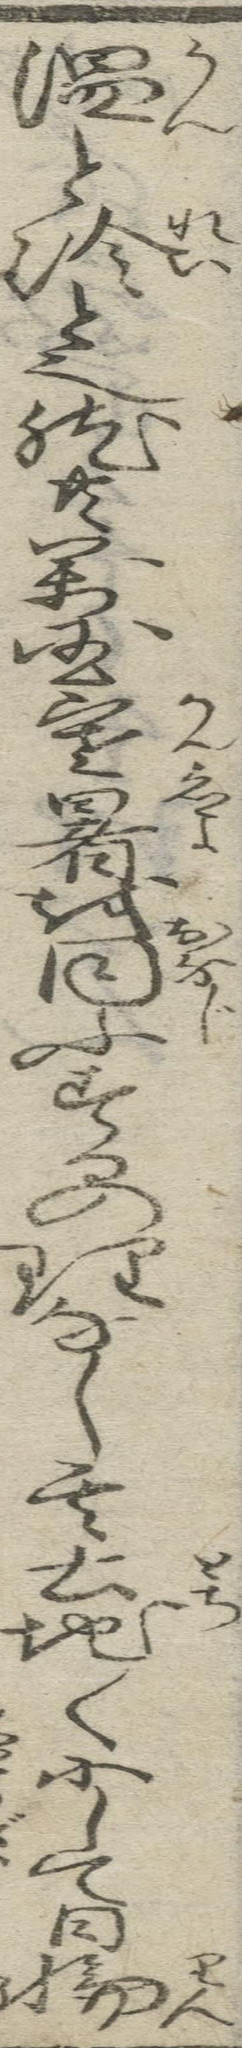温と冷と也然共万国寒暑を同にするの理なし其土地〳〵にして日輪
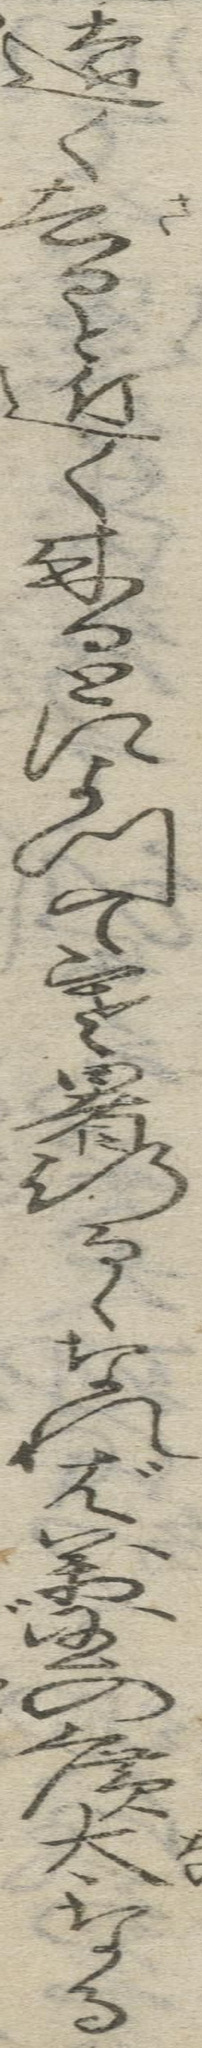遠く去と近く来るとによつて寒暑行るゝなれば万国の広太なる
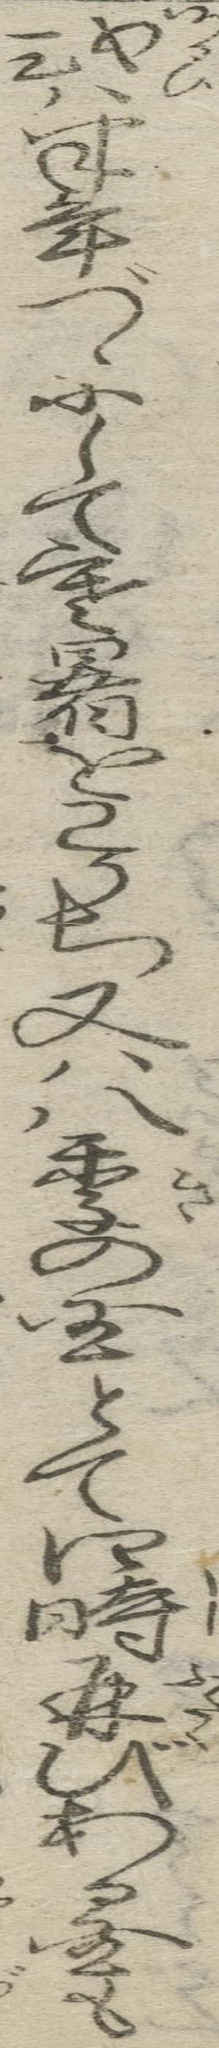或は半年づゝにして寒暑をわかち又は八季の国とて四時再びある国も
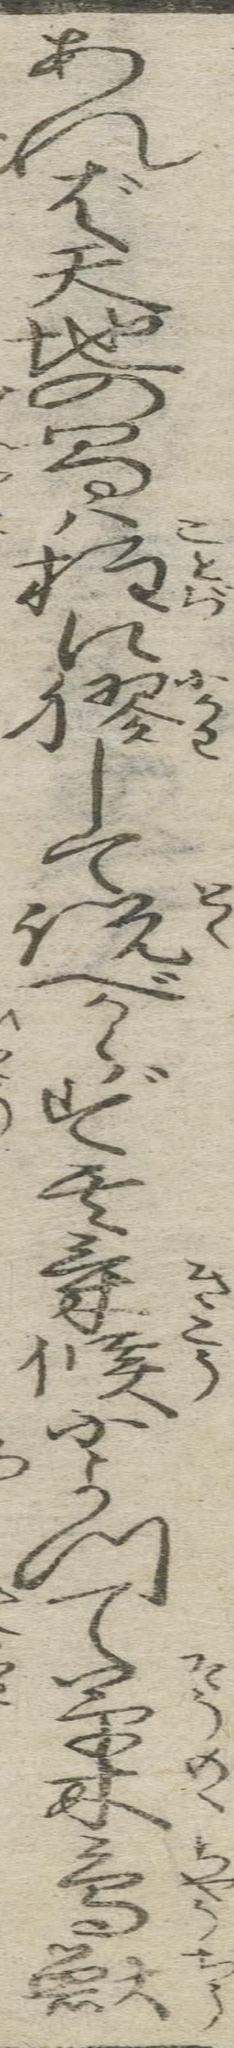あれば天地の間は柱に膠して説べからず其気候によつて草木鳥獣
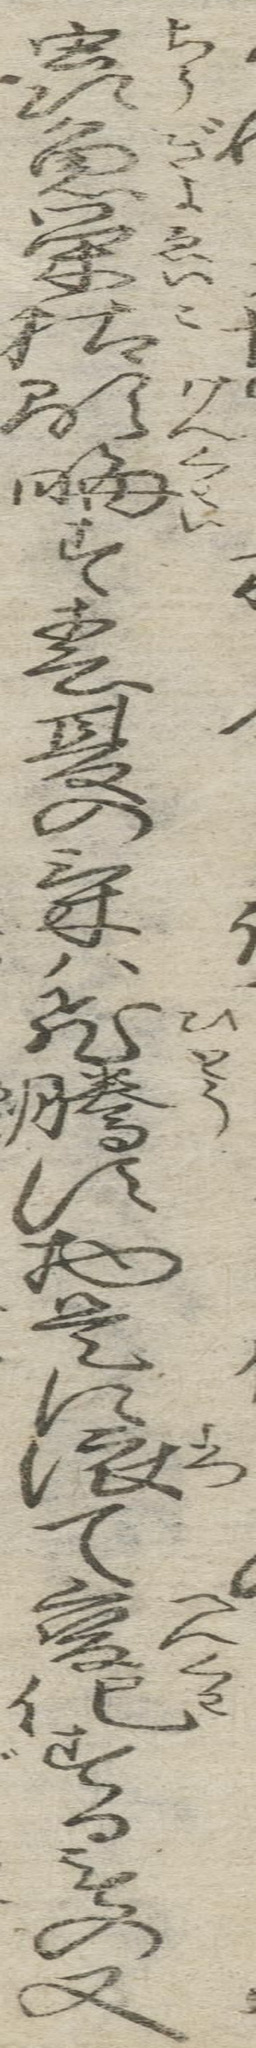虫魚栄枯顕晦す春夏の気は飛騰す物是に依て変化するもの又
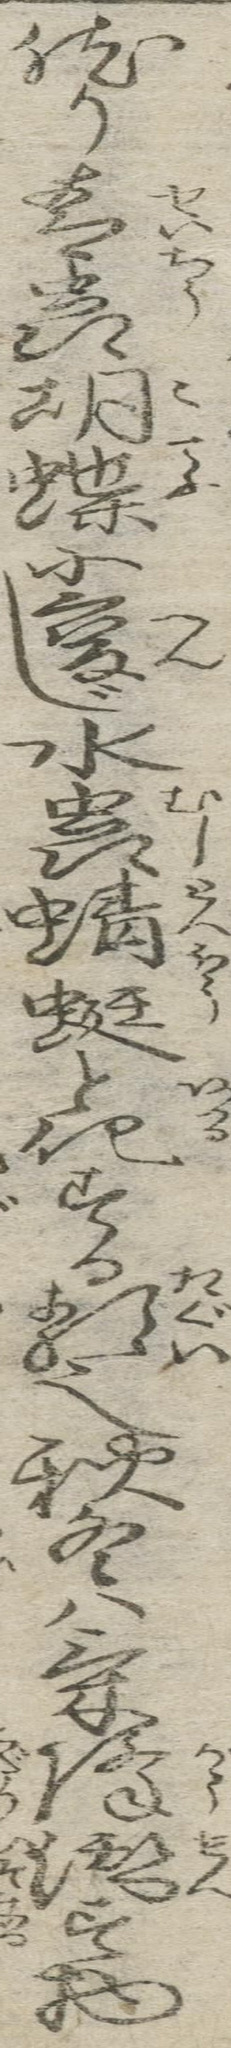然り青虫胡蝶に変じ水虫蜻蛉と化する類也秋冬は気降潜す物
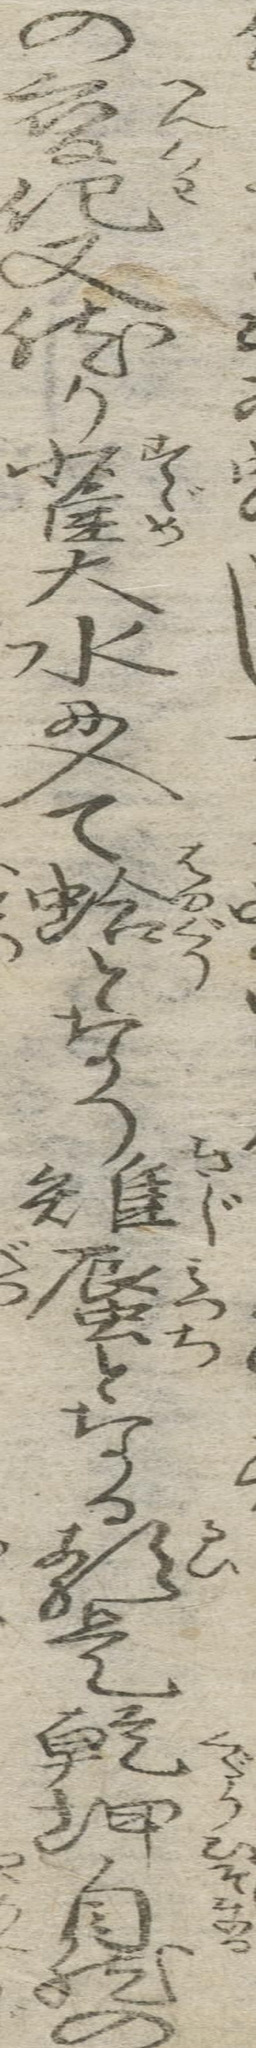の変化又然り雀大水に入て蛤となり雉蜃となる類是乾坤自然の
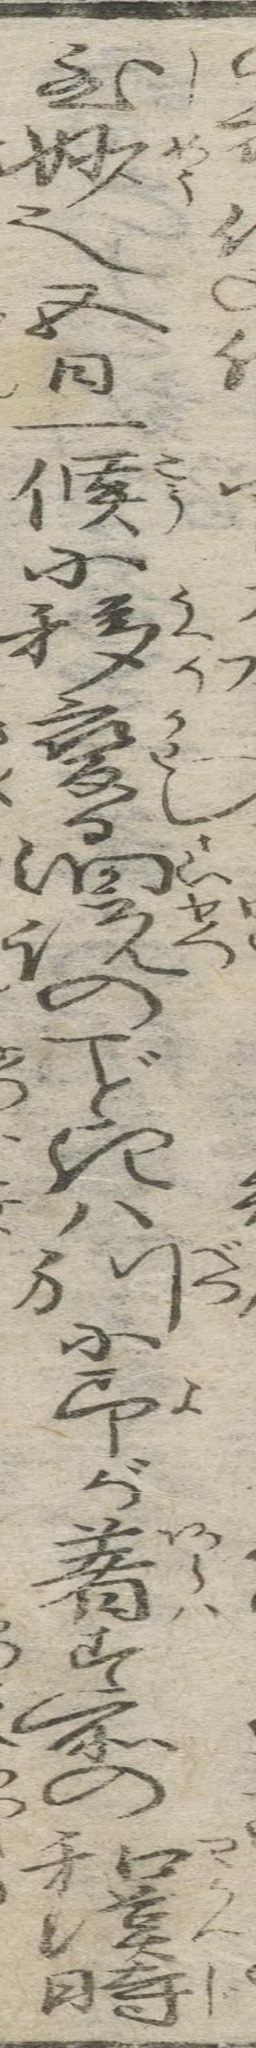至妙也五日一候に移変る細説のごとき別に予が著す所の和漢時
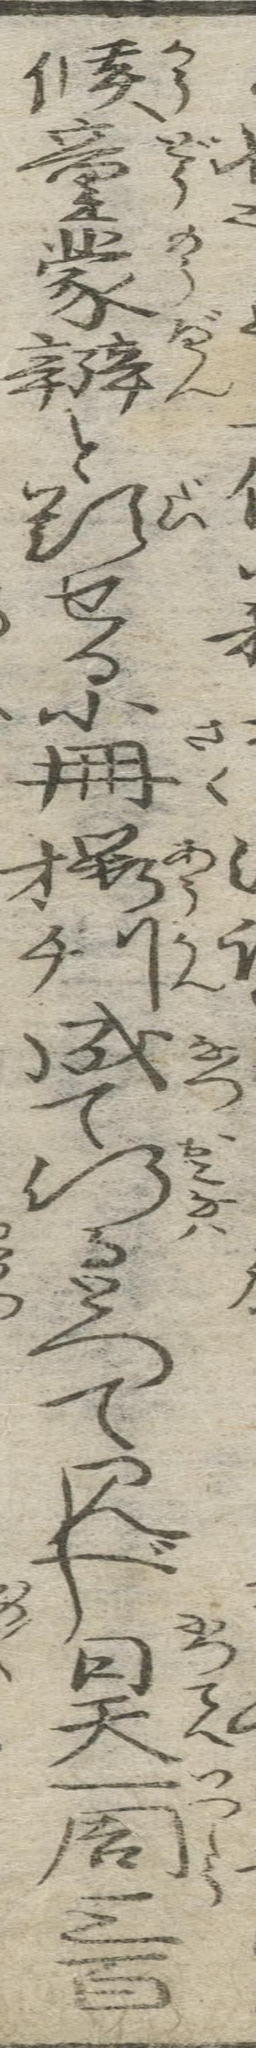候童蒙弁と題せる小冊桜刊成て行るとつて見べし日天一周三百
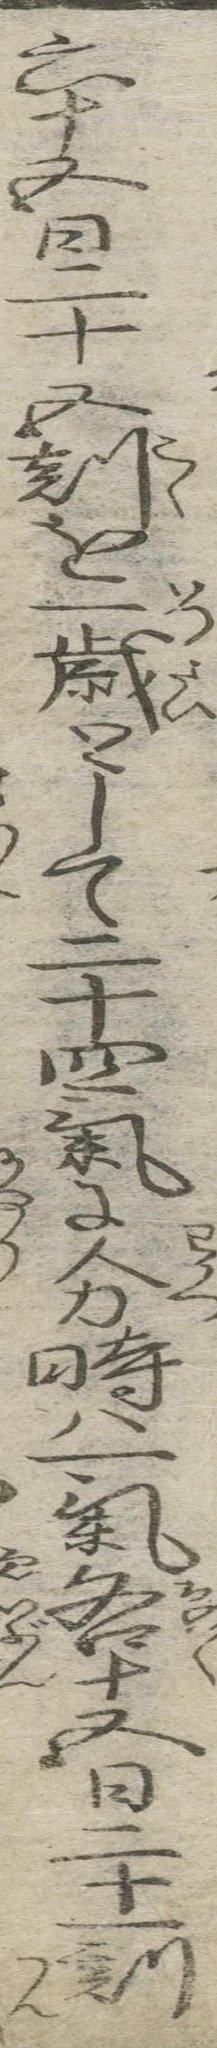六十五日二十五刻を一歳として二十四気に分時は一気各十五日二十一刻
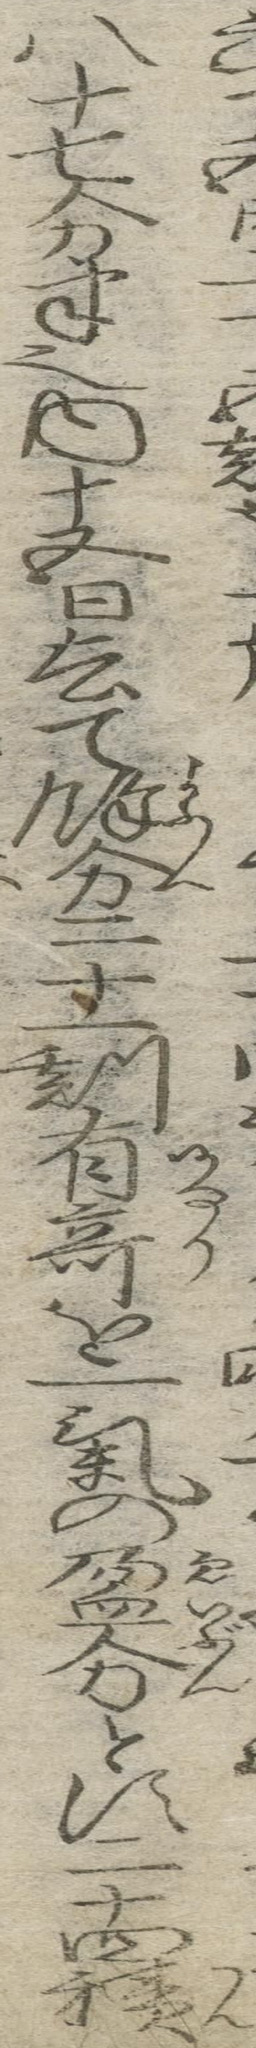八十七分半也内十五日去て余分二十一刻有奇を一気の盈分とす二十四積
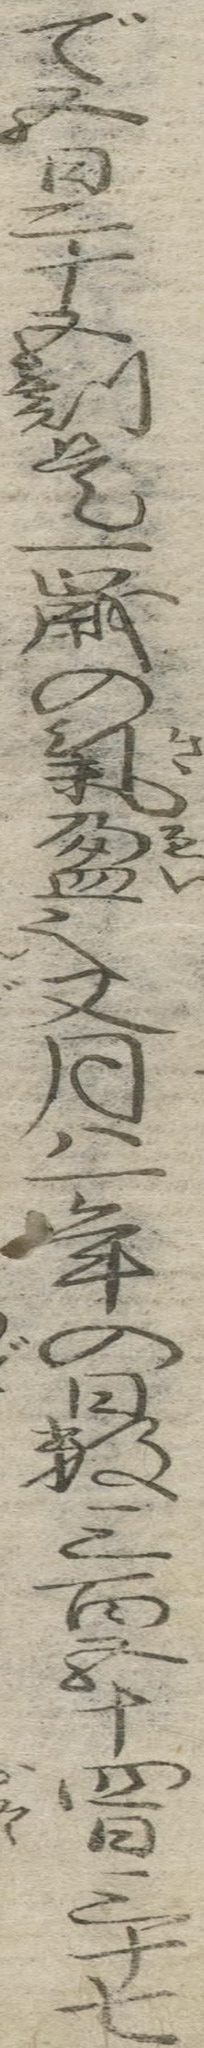で五日二十五刻是一歳の気盈也又月は一年の日数三百五十四日三十七
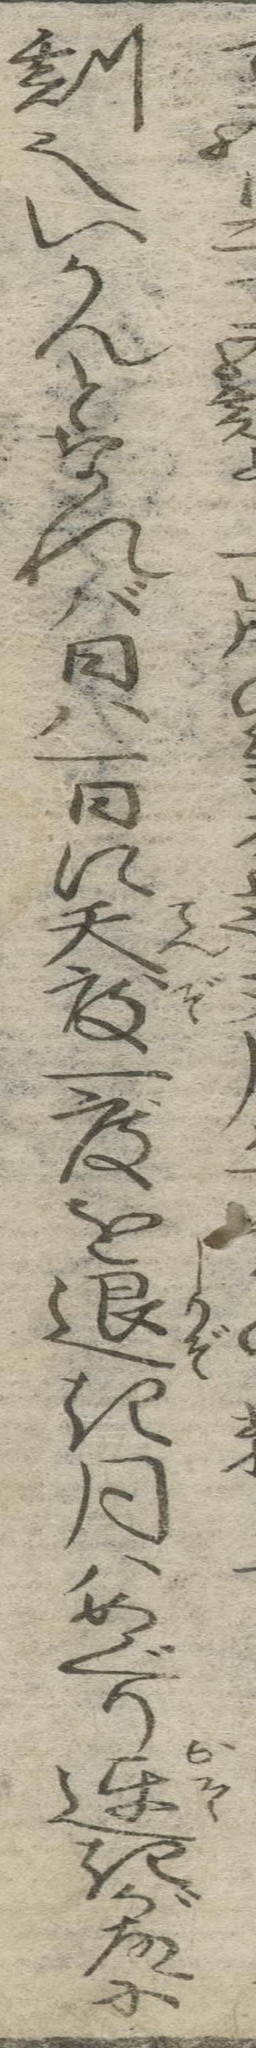刻也いかんとなれば日は一日に天度一度を退き月はめぐり遅きが故に

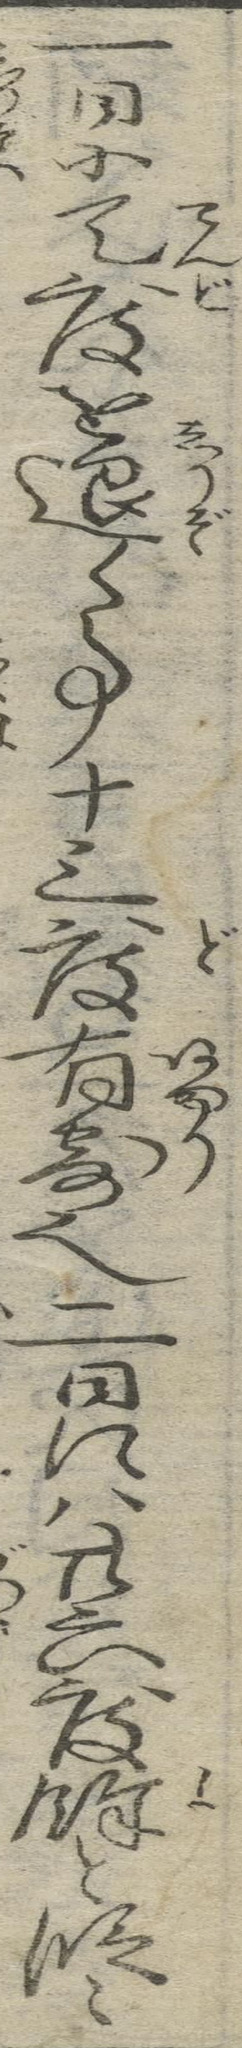一日に天度を退く事十三度有奇也二日には二十六度余と段々
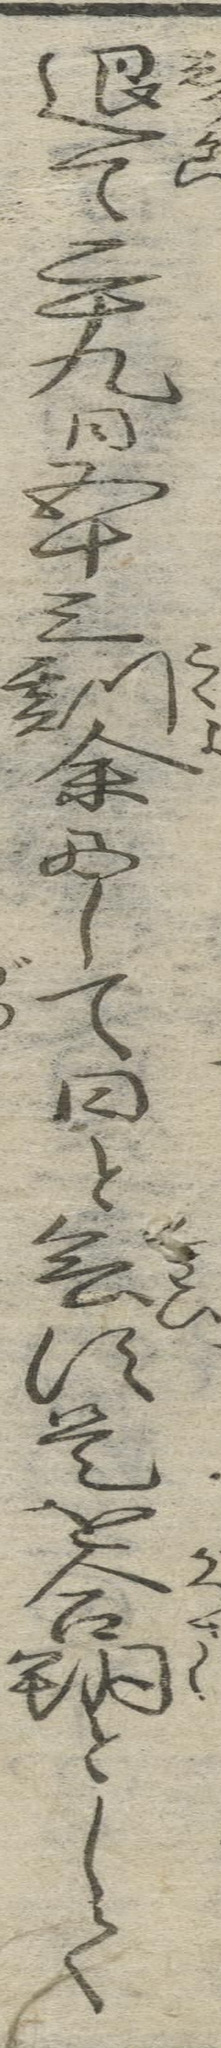退て二十九日五十三刻余にして日と会す是を合朔として
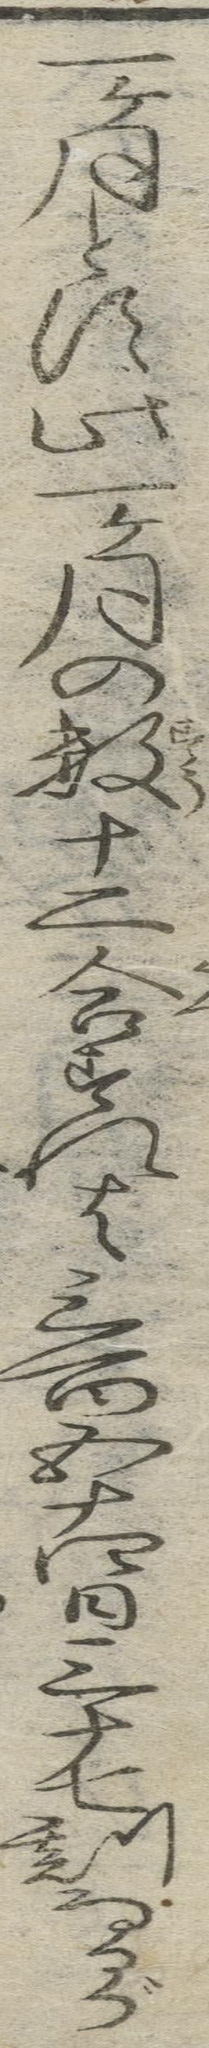一ヶ月とす此一ヶ月の数十二合すれは三百五十四日三十七刻なるが
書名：訓蒙天地辨　天
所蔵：東京大学地震研究所図書室 Earthquake Research Institute Library, The University of Tokyo, JAPAN
